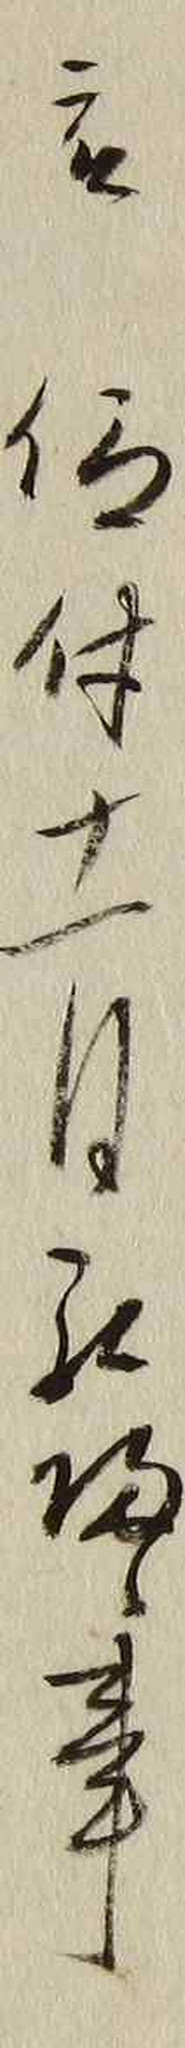被仰付十一月罷帰候事
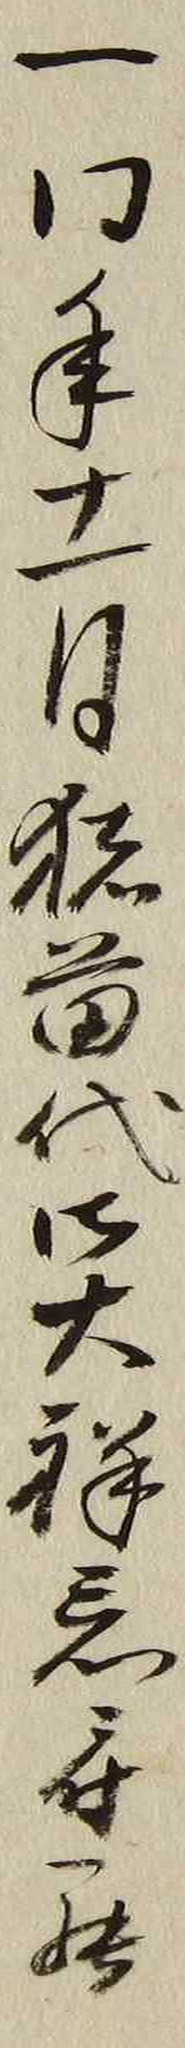一同年十一月猪苗代御大祥忌ニ付罷
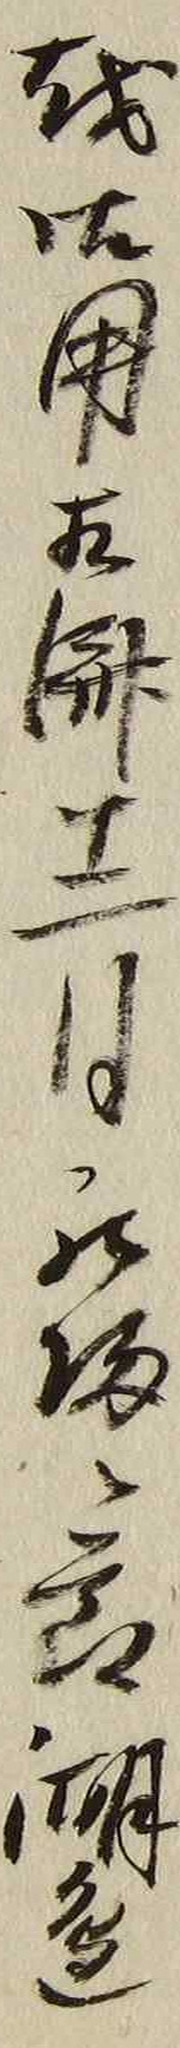越御用相済十二月罷帰候節湖辺
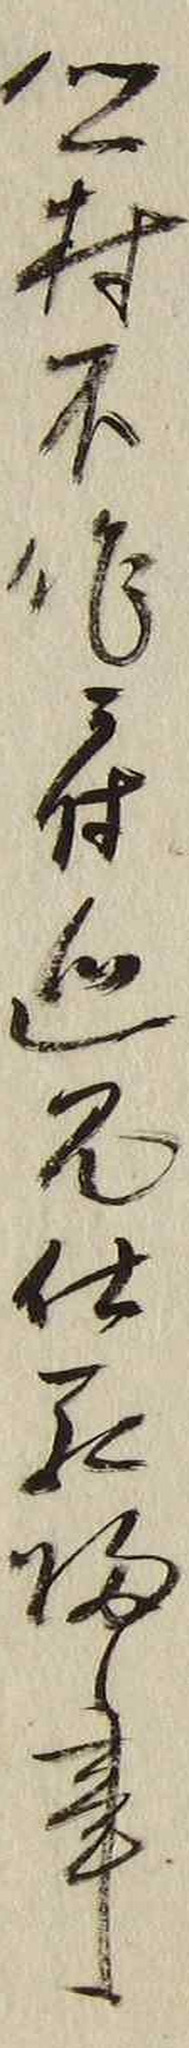郷村不作ニ付巡見仕罷帰候事
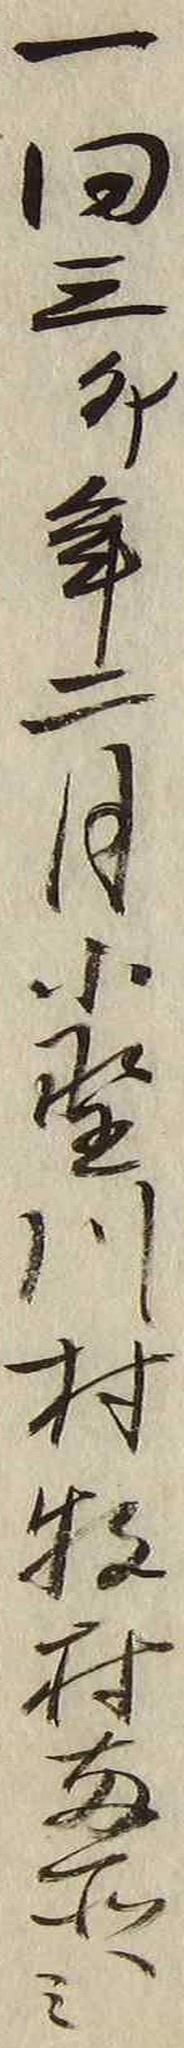一同三卯年二月小野川村牧村両所へ之

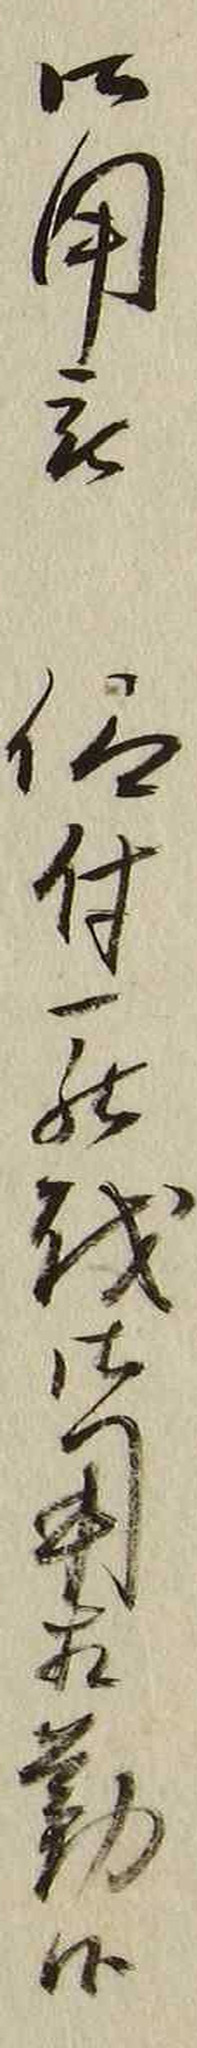御用被仰付罷越御用相勤候
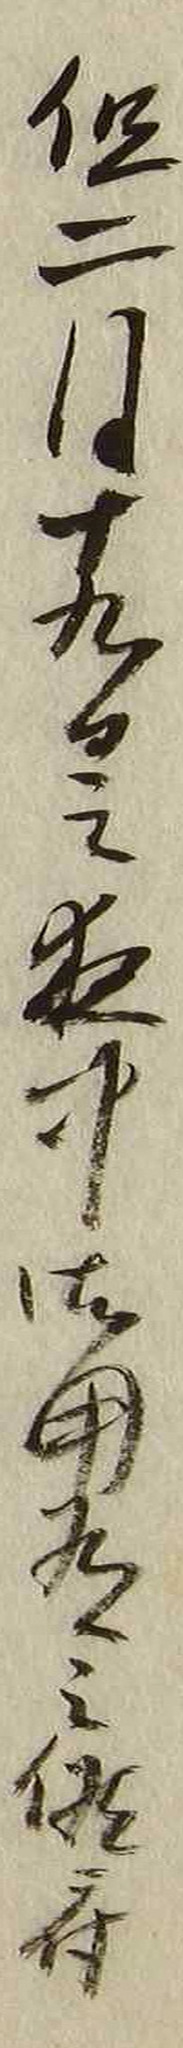但二月十九日之夜中御用有之候ニ付
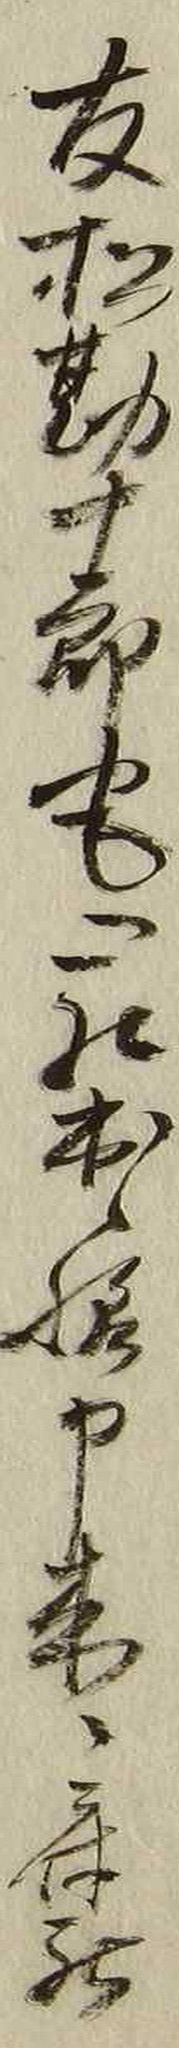友松勘十郎宅へ罷出候様申来候ニ付罷
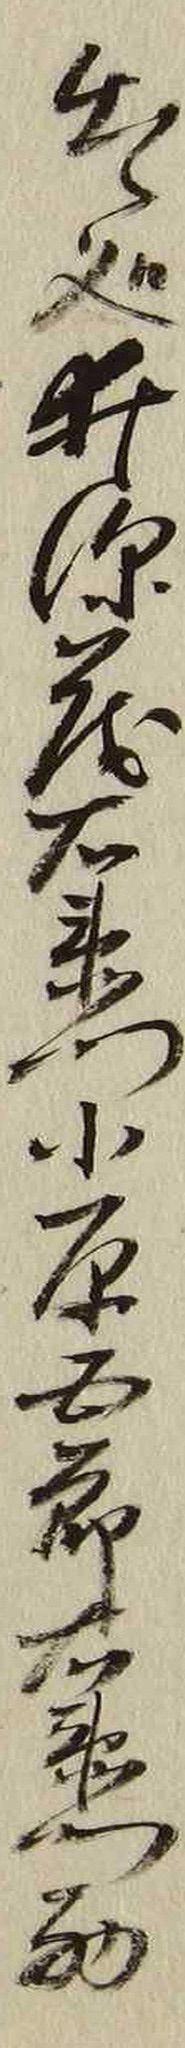出候処井深茂右衛門小原五郎右衛門西
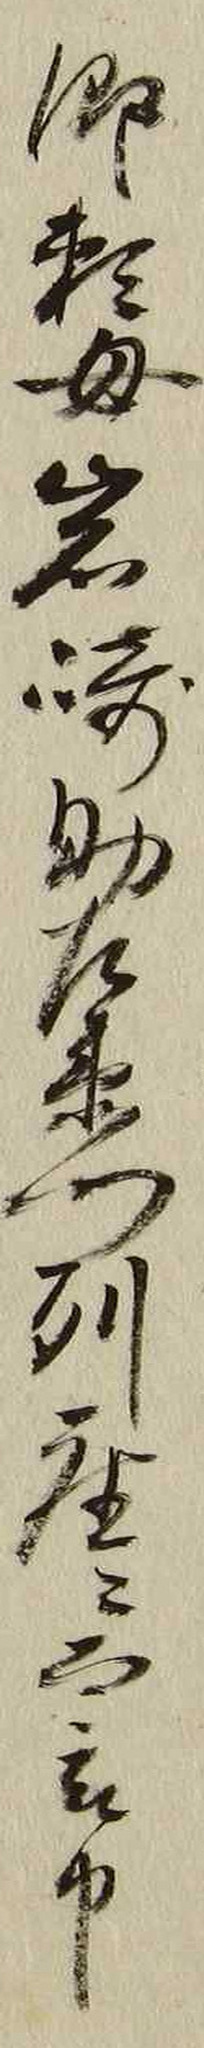郷頼母岩崎助左衛門列座ニ而被申
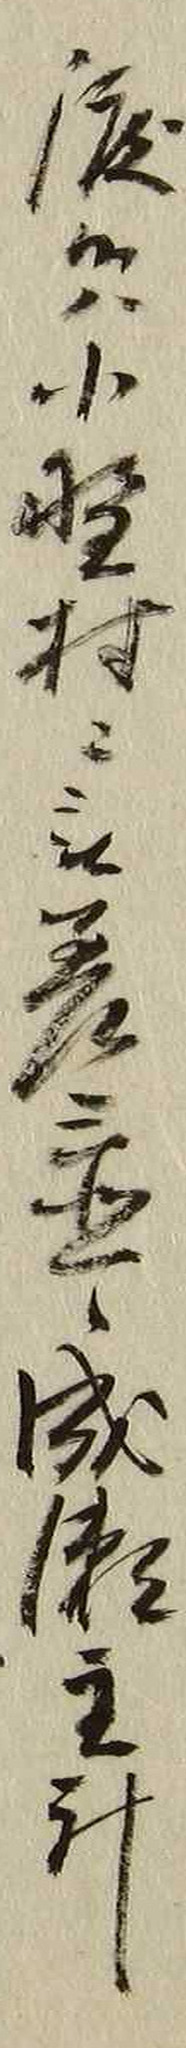渡候ハ小野村ニ被差置候成瀬主計
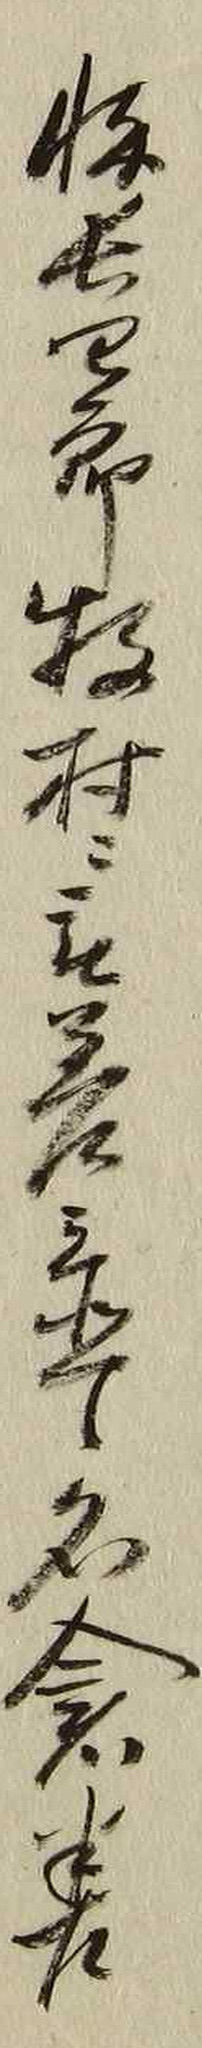忰長四郎牧村ニ被差置候名倉半左
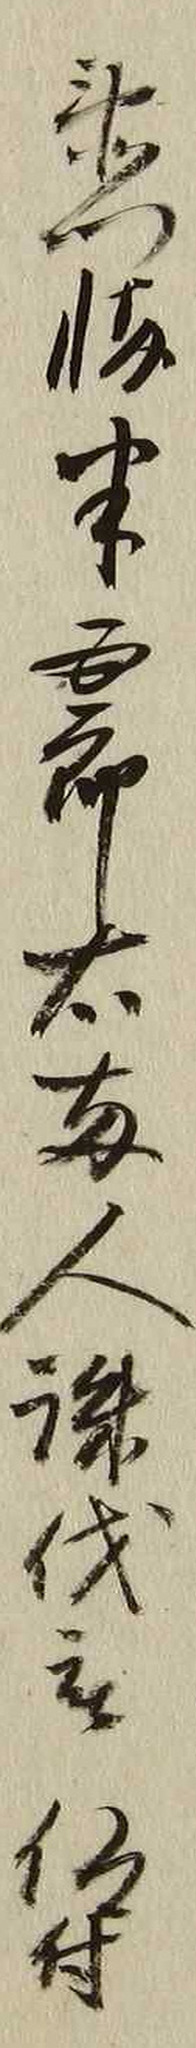衛門忰半五郎右両人誅伐被仰付
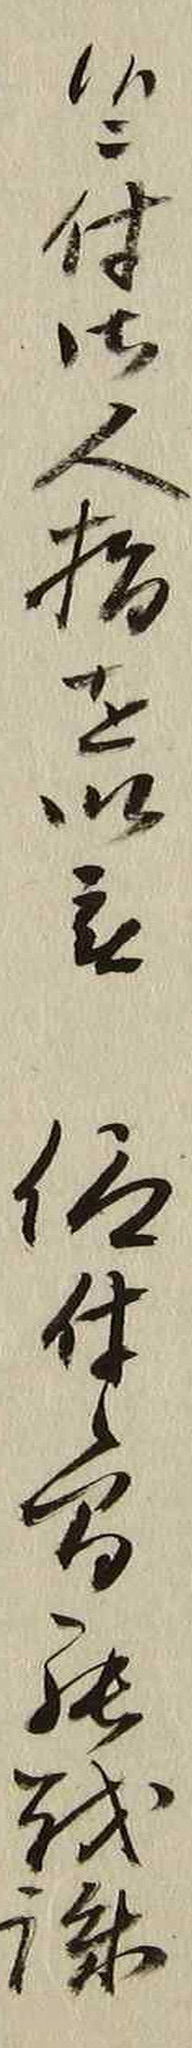候ニ付御人指を以被仰付候間罷越誅
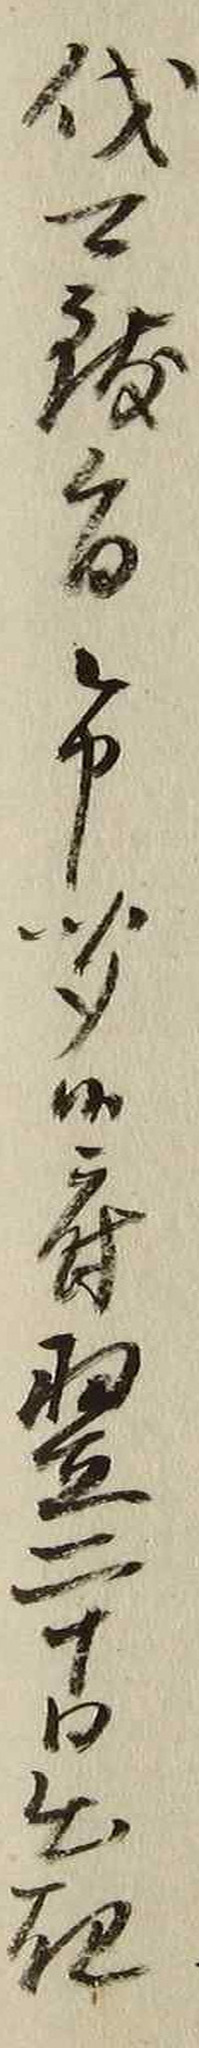伐可致旨被申聞候ニ付翌二十日出起
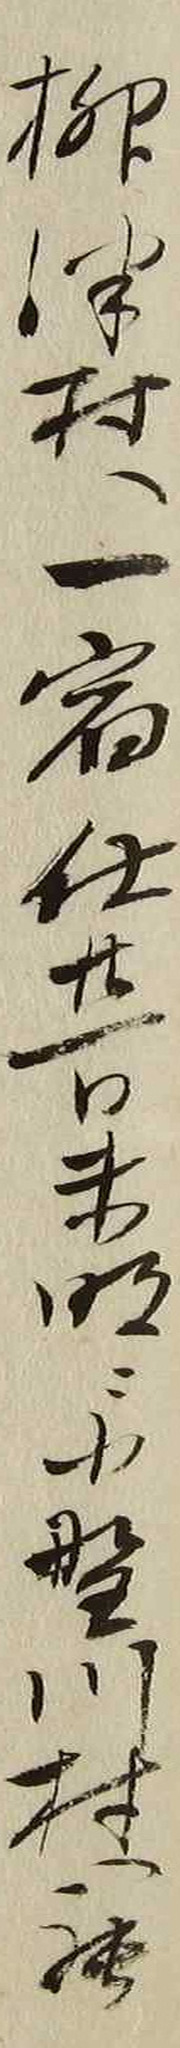柳津村へ一宿仕廿一日末明ニ小野川村へ罷
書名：諸士系譜　巻之352　す之部2
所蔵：会津若松市立会津図書館
